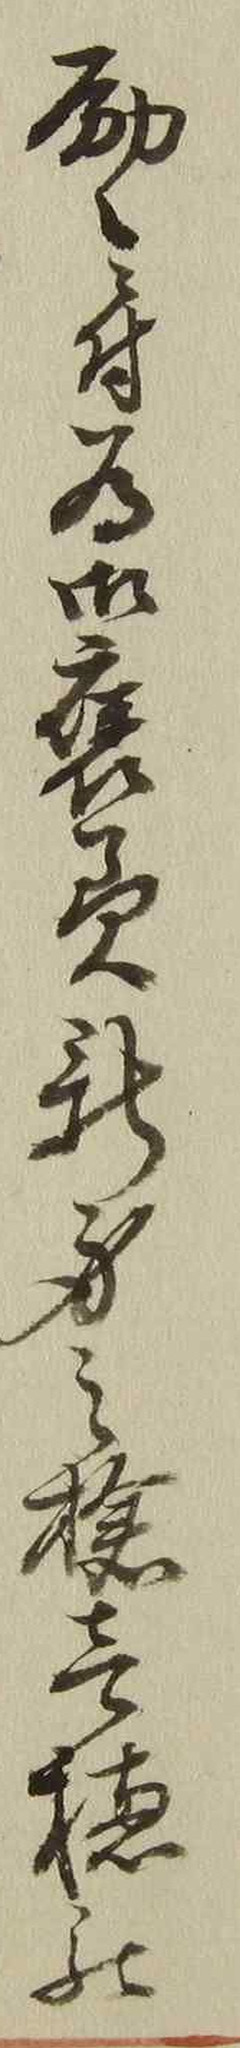励候ニ付為御褒美新身之槍壱穂被
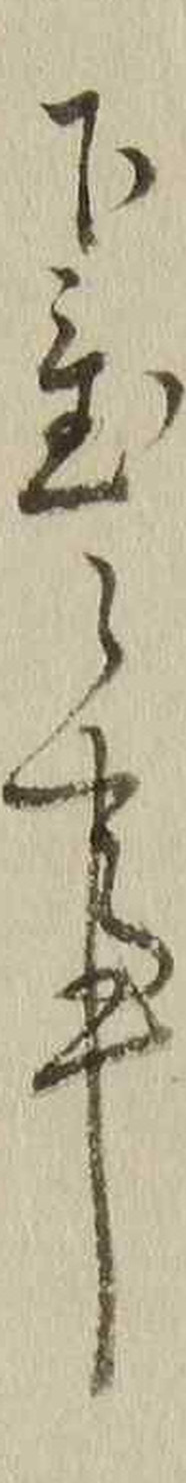下置候事
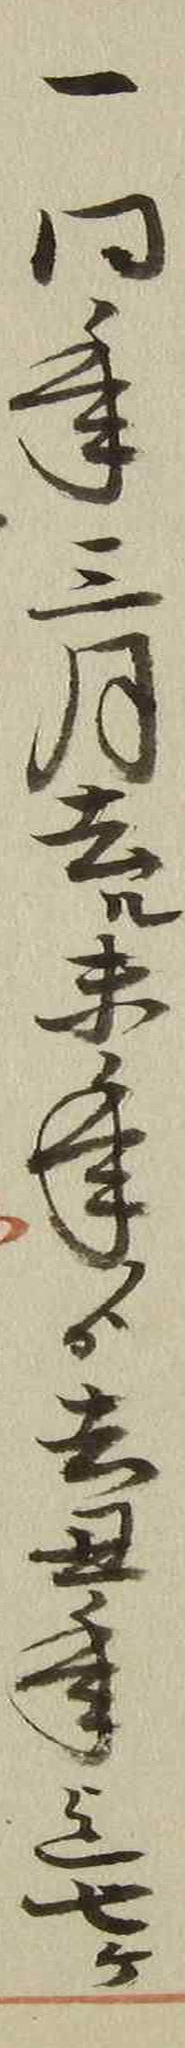一同年三月去ル未年ゟ去丑年迄七ヶ
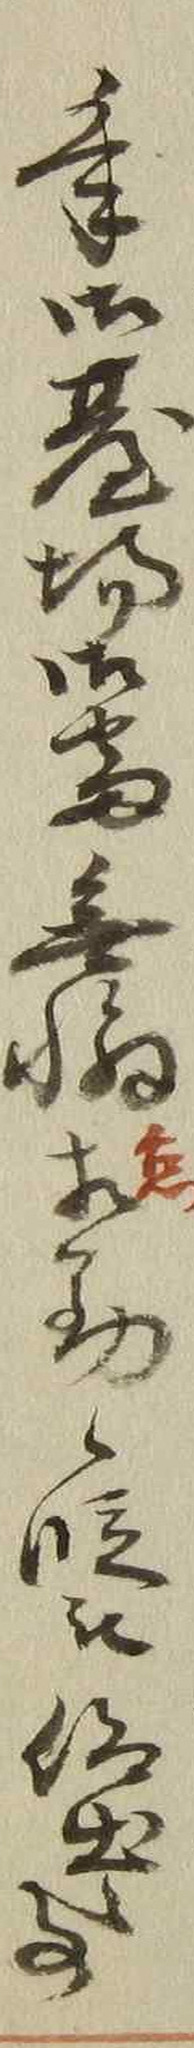年御台場御番無懈怠相勤候段被仰出候事
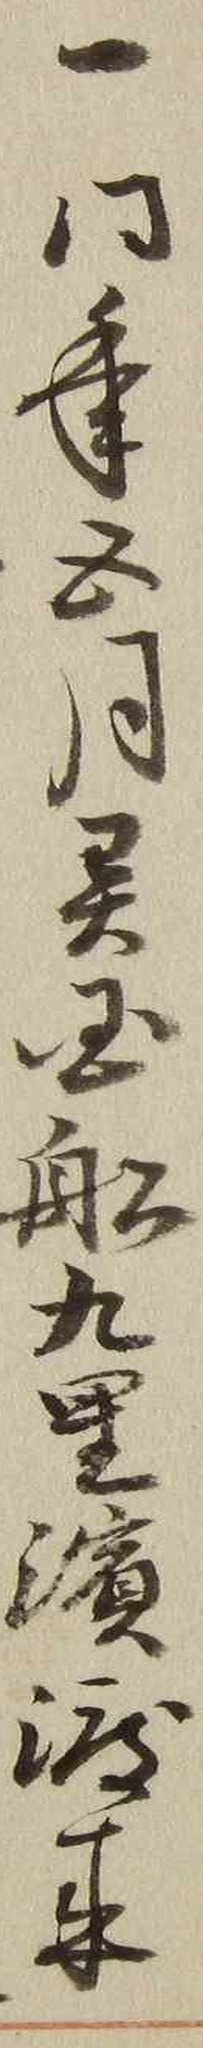一同年五月異国船久里浜渡来
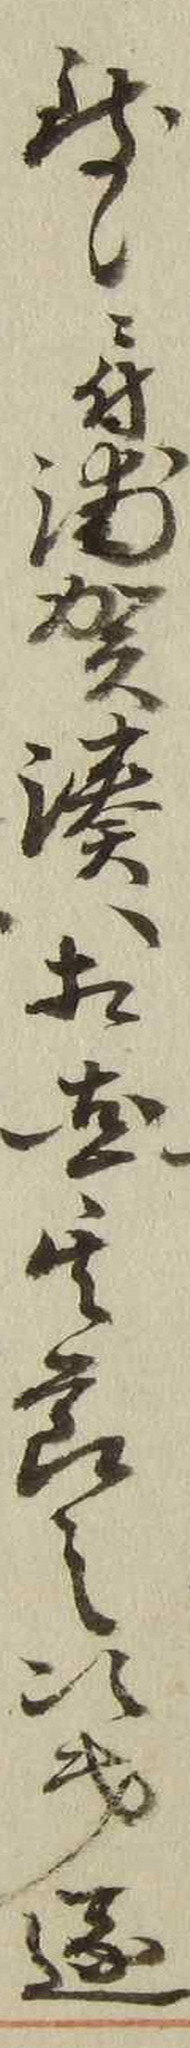致候ニ付浦賀湊へ相固其節之次第逐
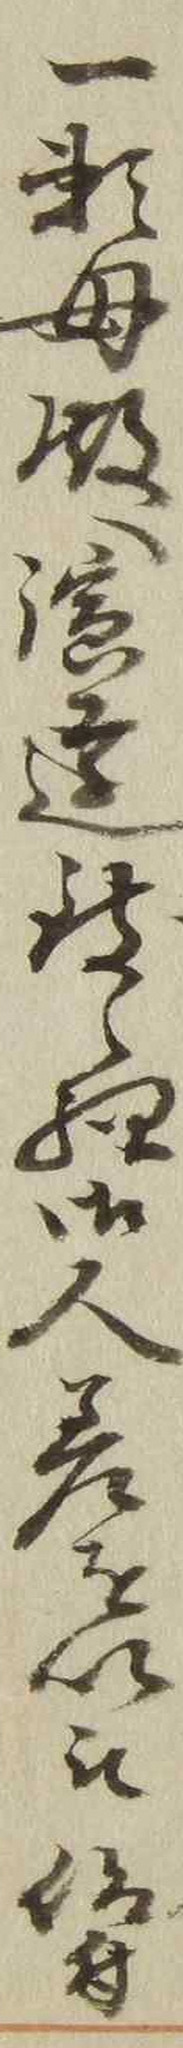一頼母殿へ演達致候様御人差を以被仰付
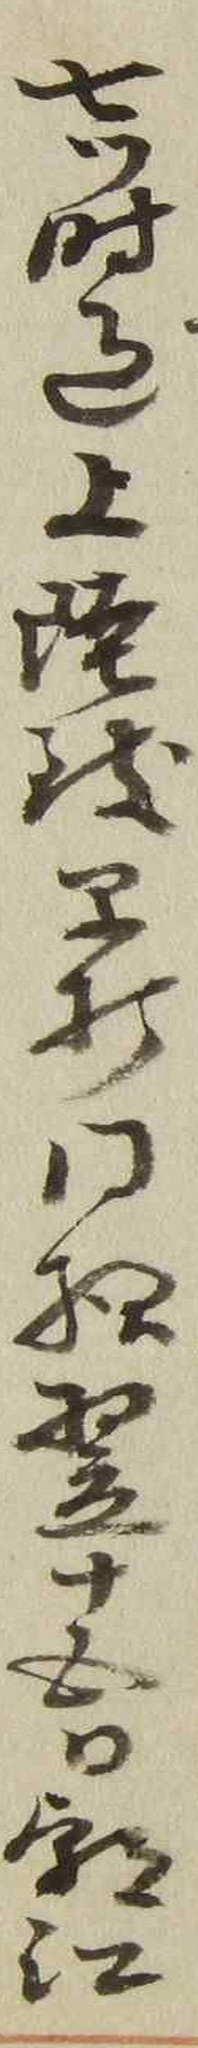七ツ時過上陸致早打同様翌十五日朝江
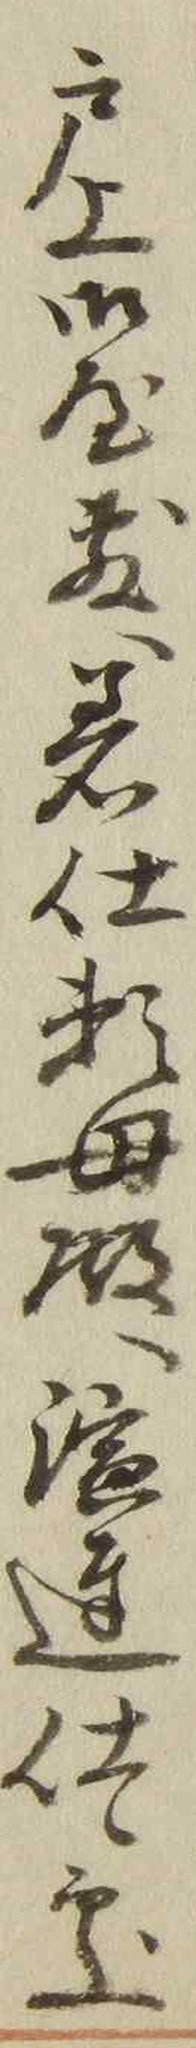戸上屋敷へ着仕頼母殿へ演達仕候処
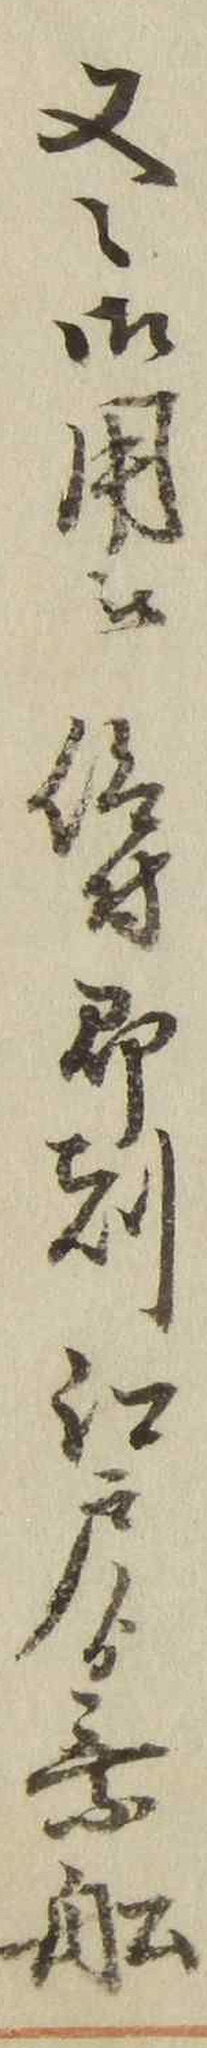又々御用被仰付即刻江戸ゟ乗船

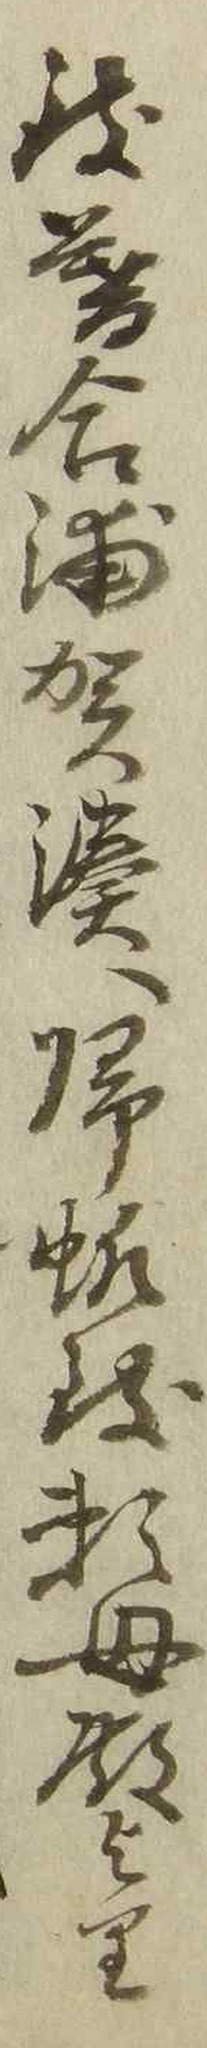致暮合浦賀湊へ帰帆致頼母殿より
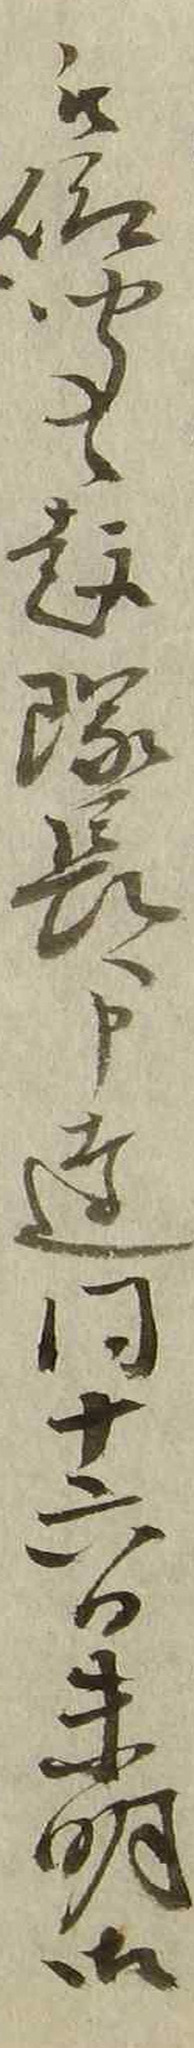被仰聞候趣隊長へ申達同十六日未明御
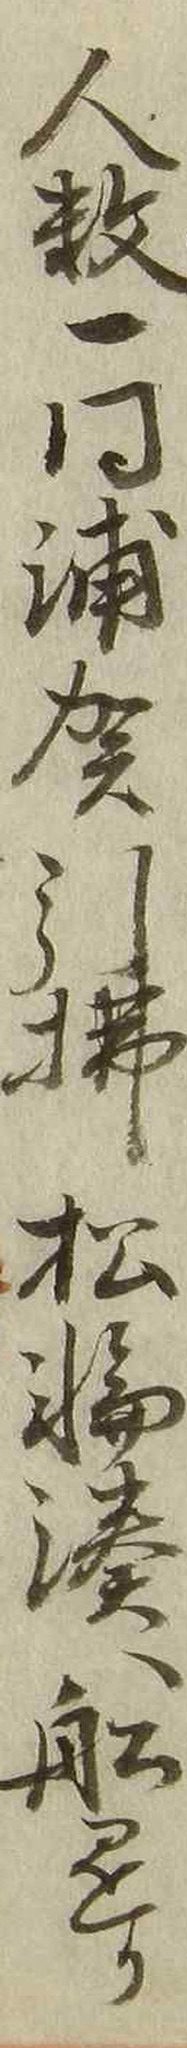人数一同浦賀引払松輪湊へ船懸り
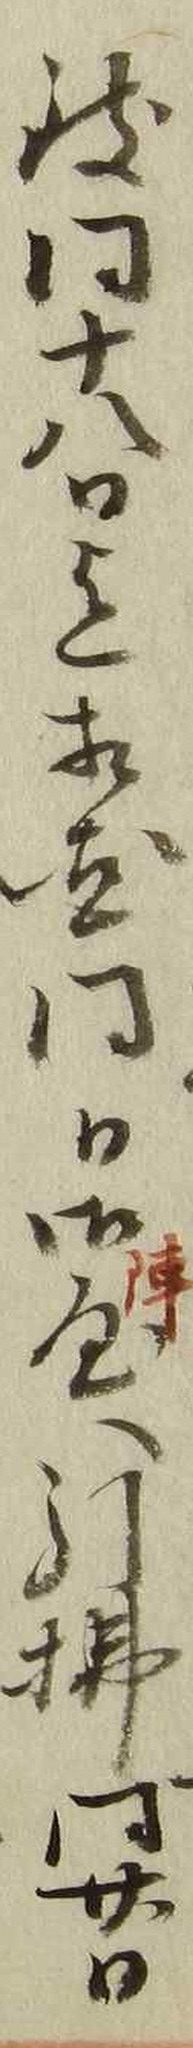致同十八日迄相固同日御陣屋へ引払同廿日
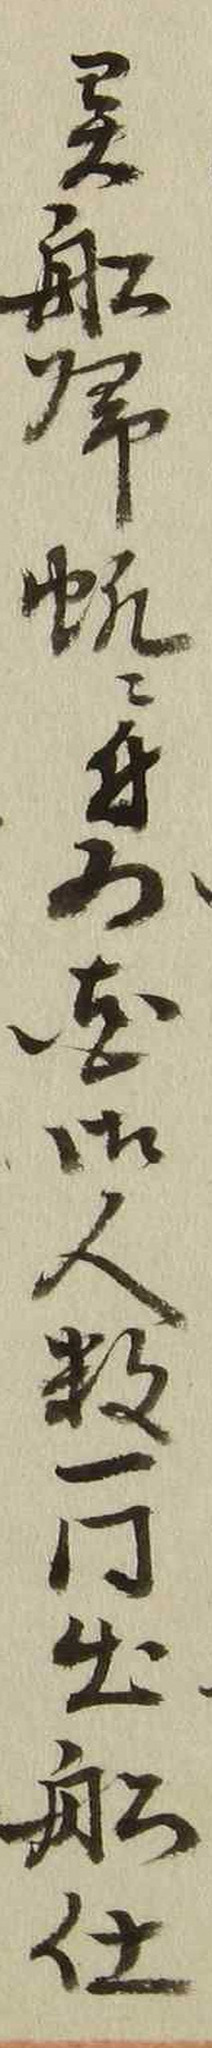異船帰帆ニ付為固御人数一同出船仕
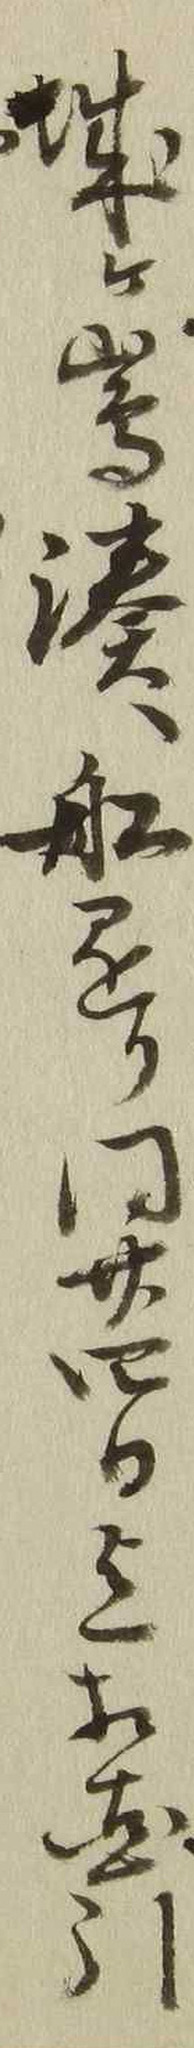城ヶ崎湊へ船懸り同廿四日迄相固引
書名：諸士系譜　巻之53　に之部4
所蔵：会津若松市立会津図書館
